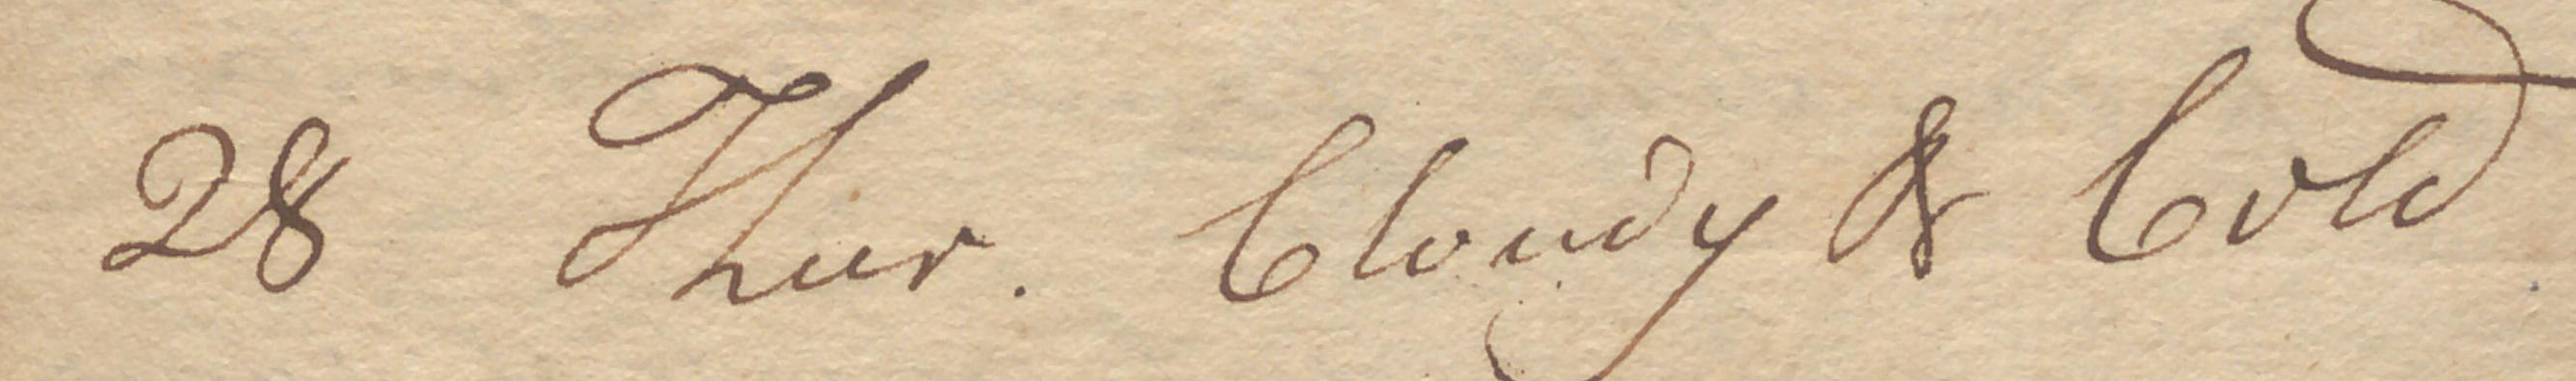28 Thur Cloudy & Cold
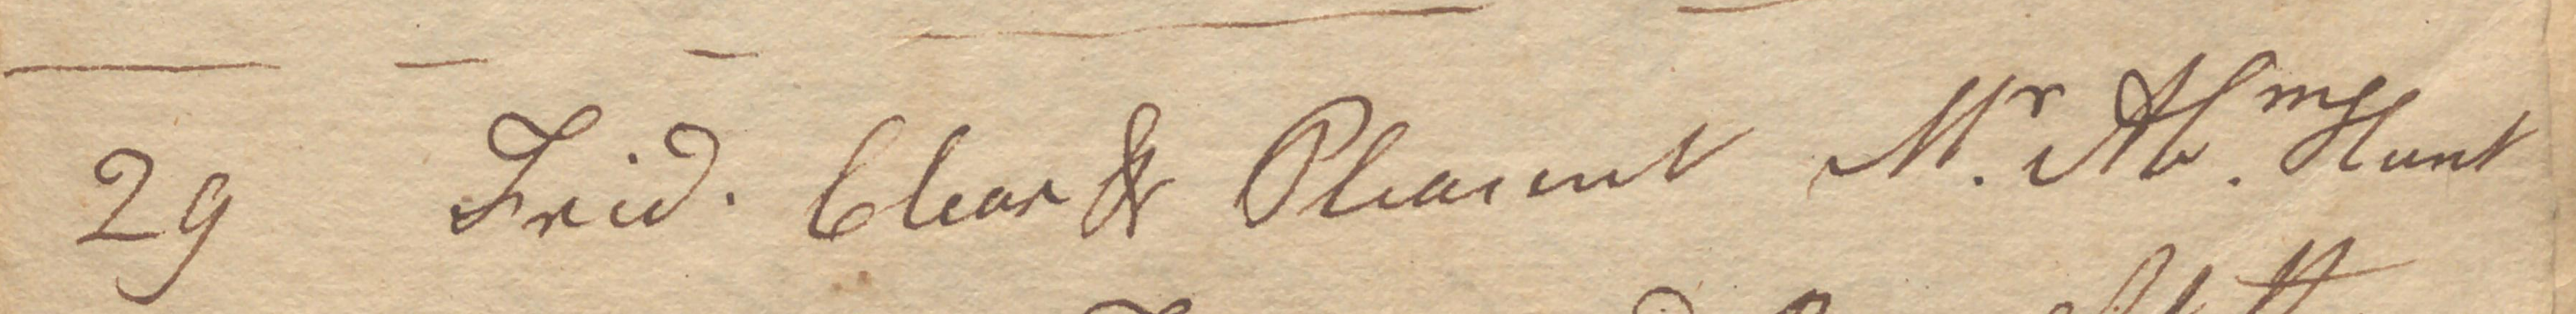29 Frid. Clear & Pleasent M^r. Ab^m. Hunt
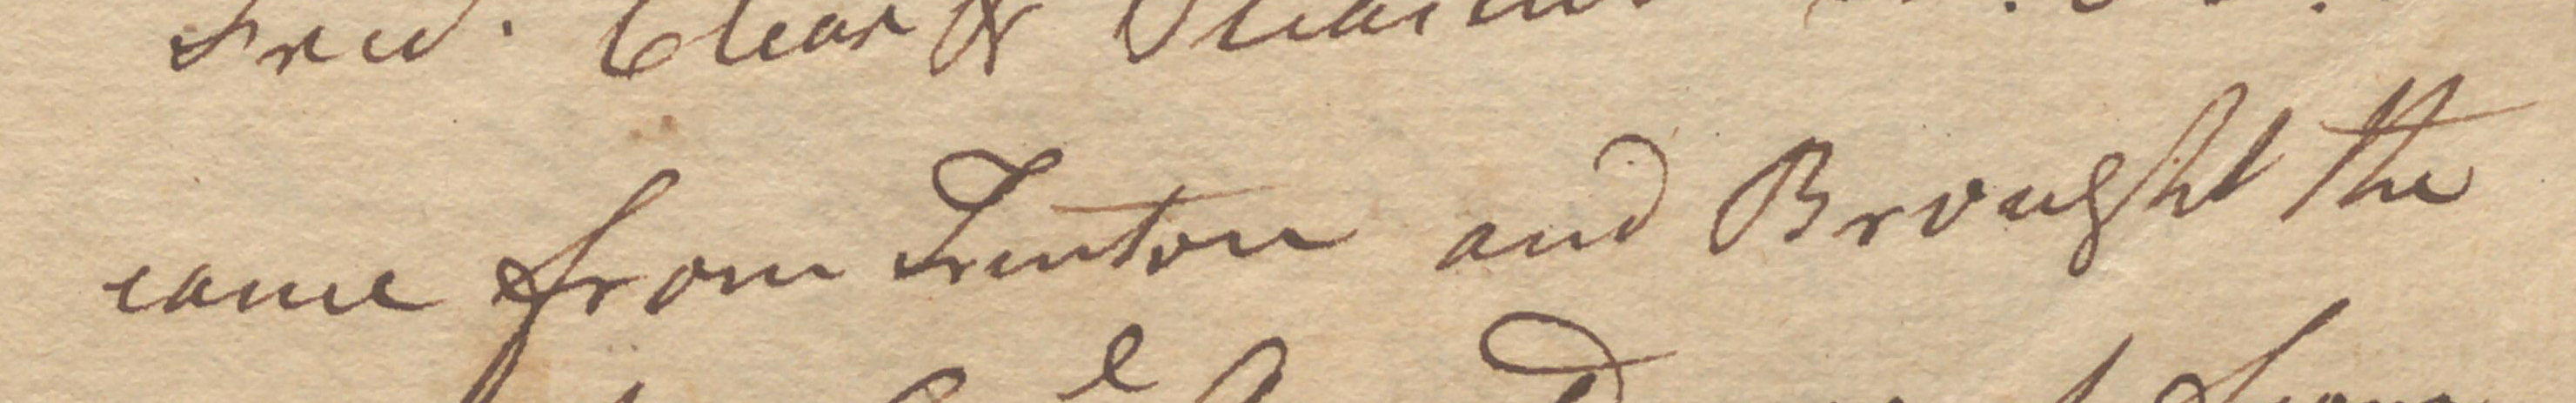came from Trenton and Brought the
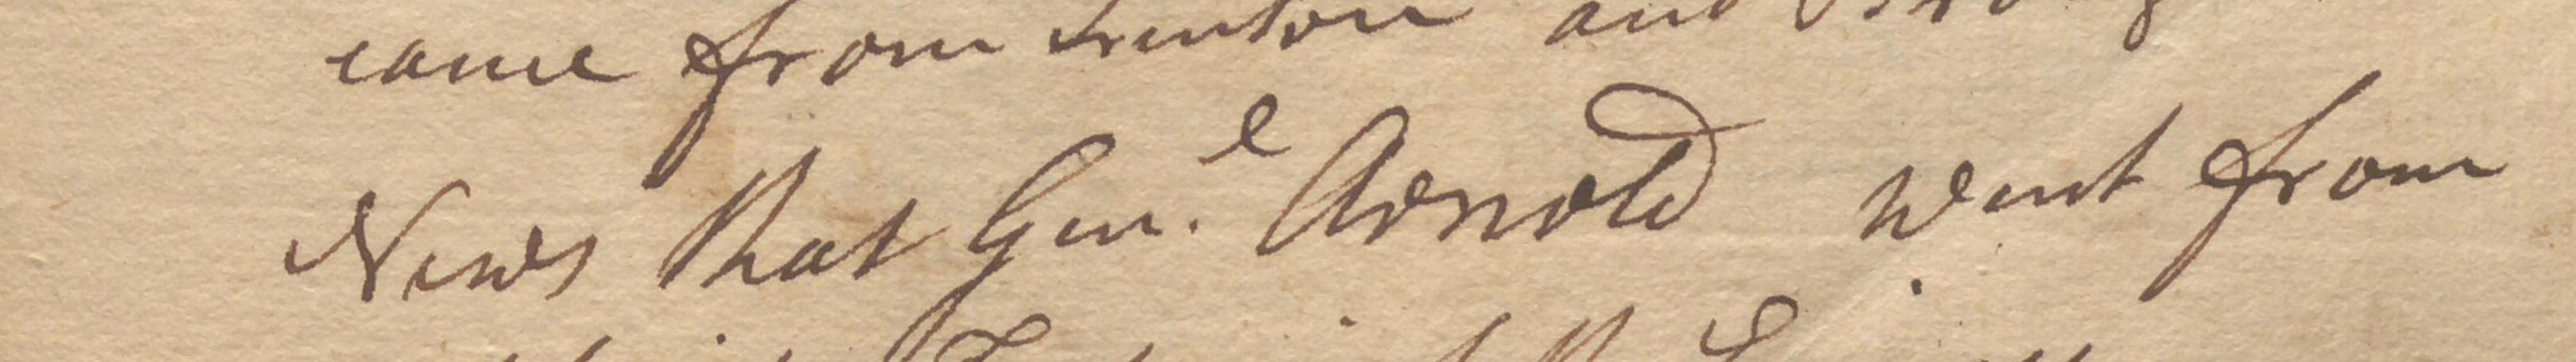News that Gen^l. Arnold went from
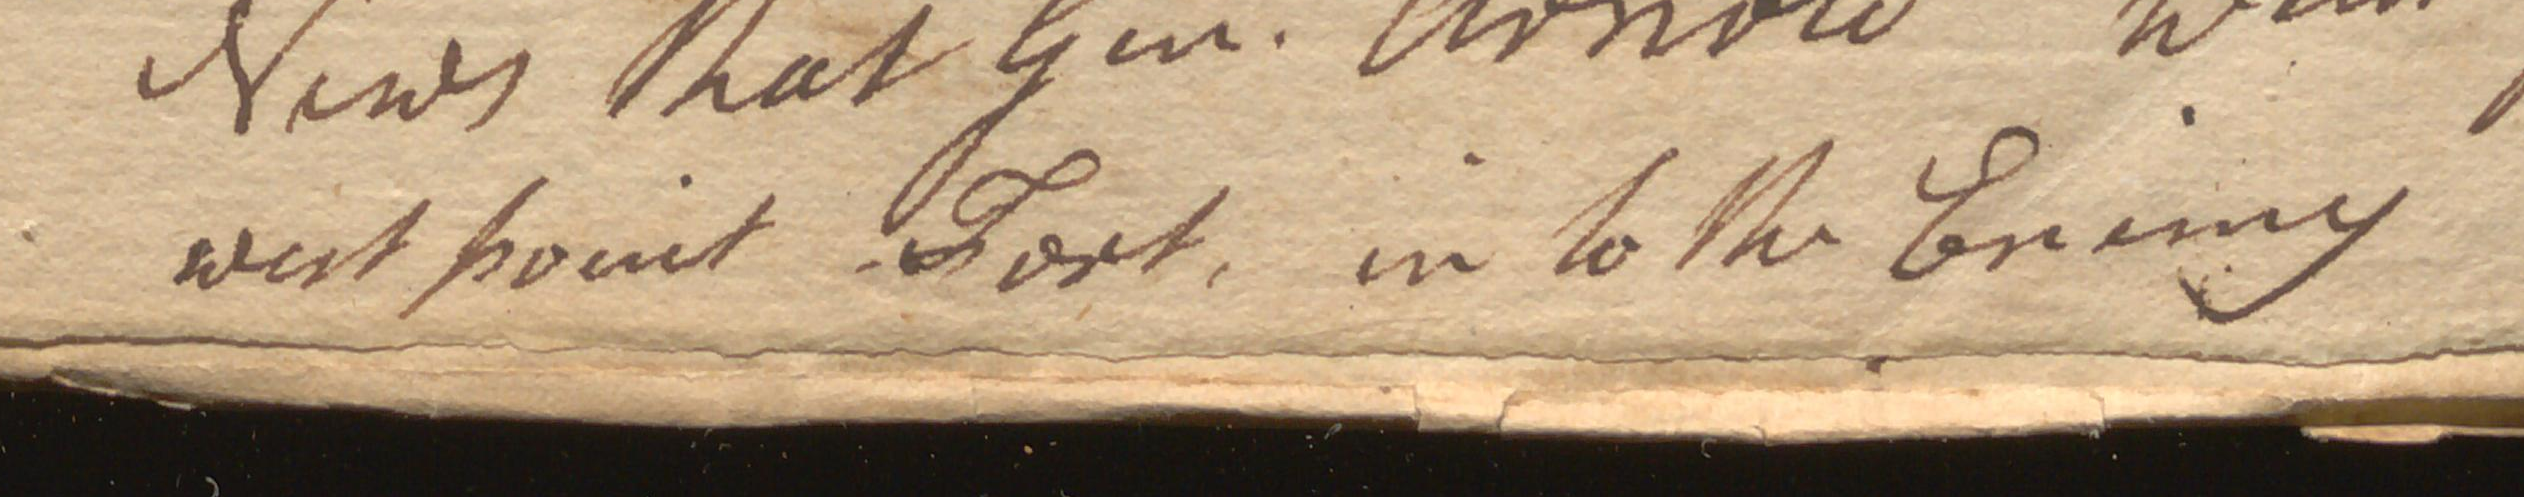west point Fort, in to the Enemy
